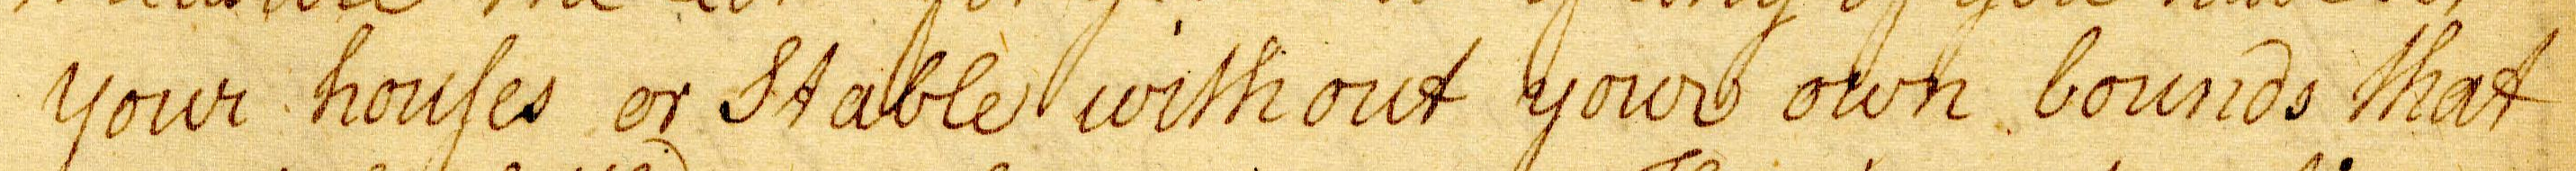your houses or Stable without your own bounds that
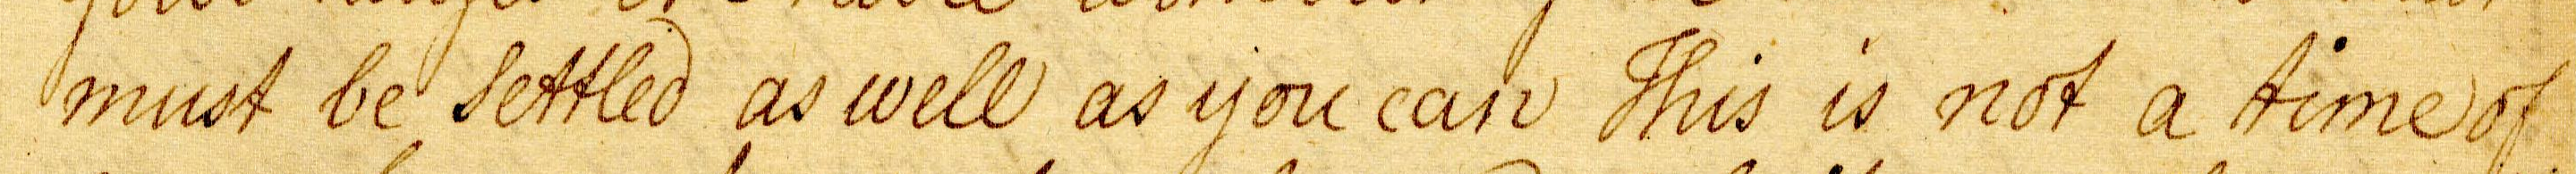must be settled as well as you can This is not a time of
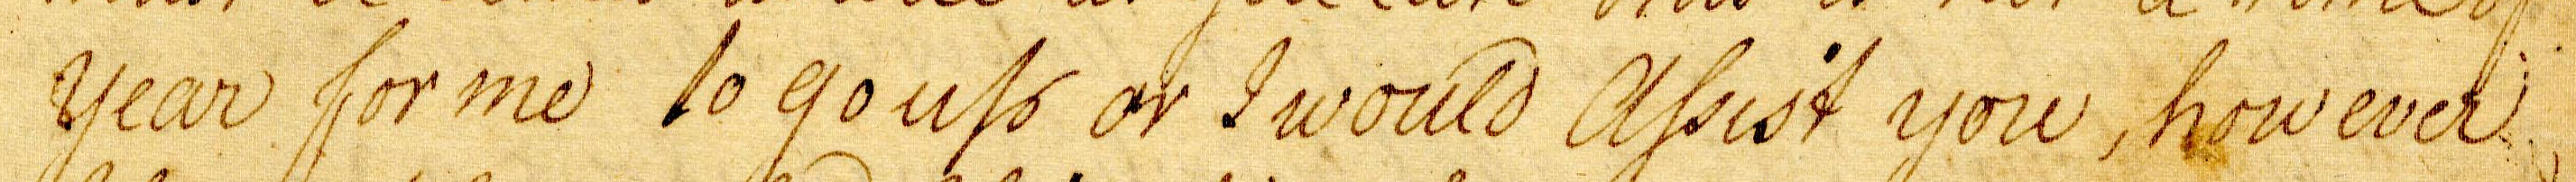Year for me to guess or I would Assist you, however
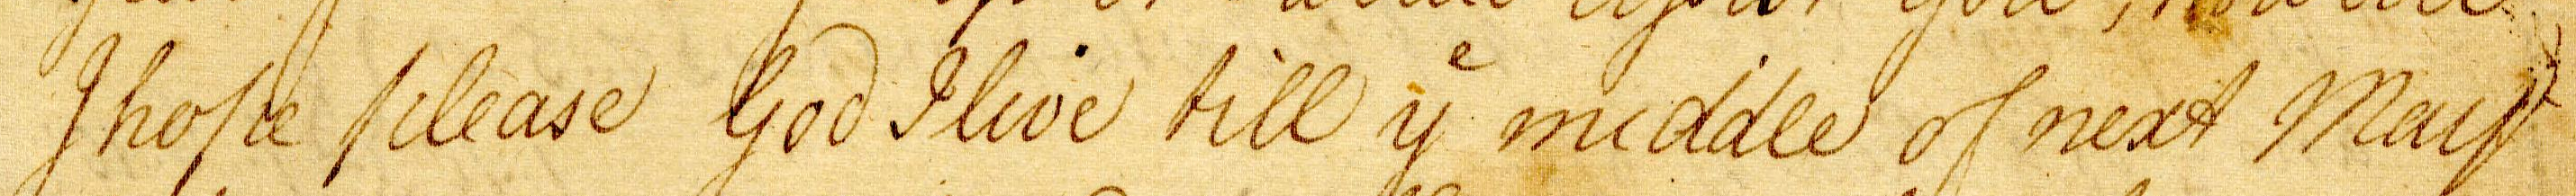I hope please God I live till y^e middle of next May
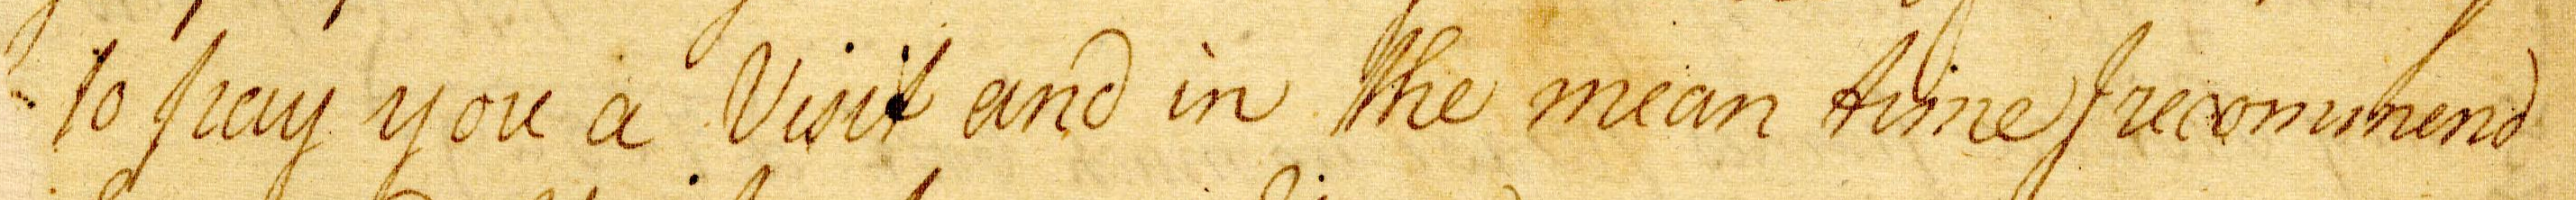to pay you a Visit and in the mean time I recommend
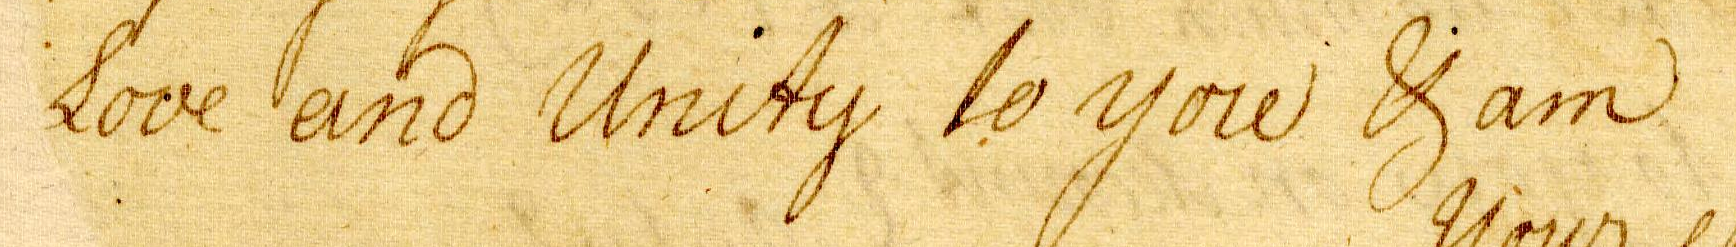Love and Unity to you & am
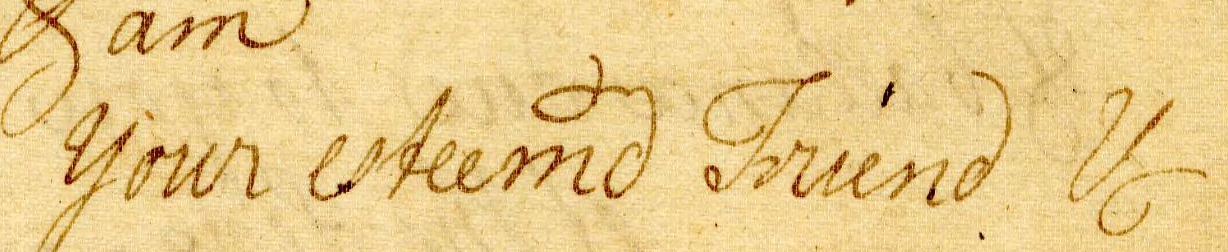Your esteemd Friend &
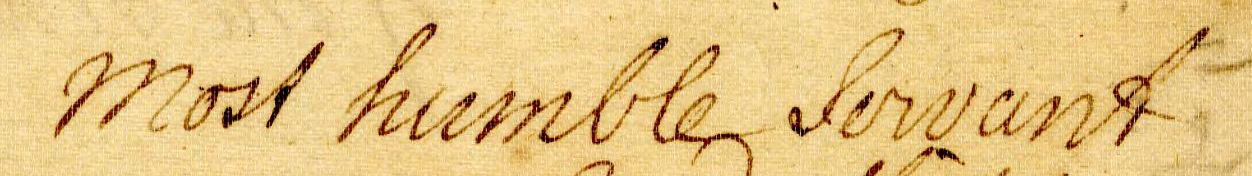Most humble servant
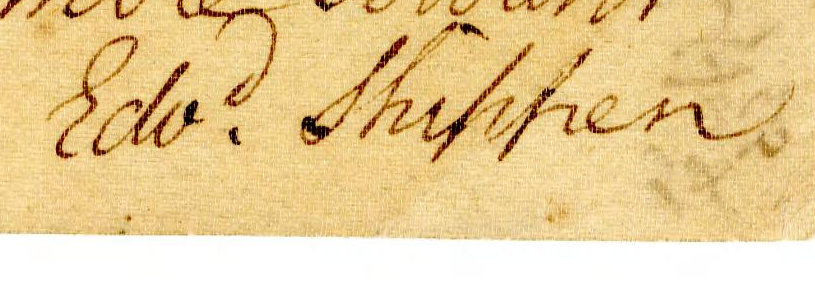Edw^d. Shippen
